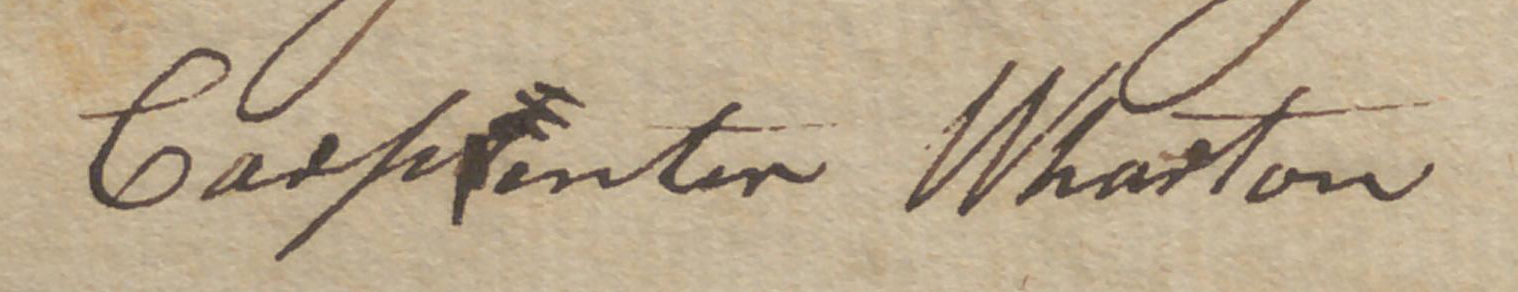Carpenter Wharton
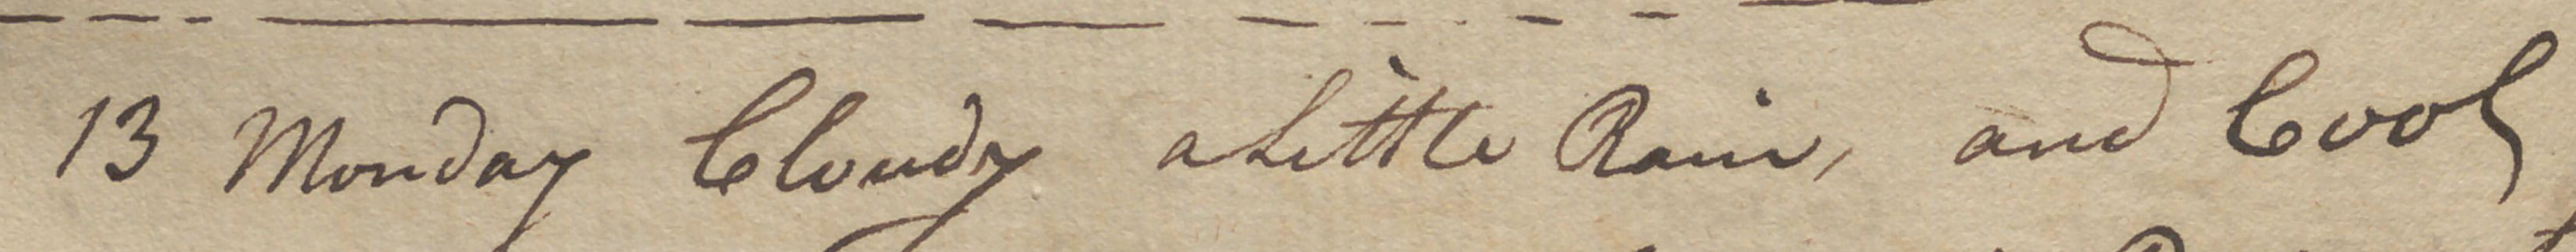13 Monday Cloudy a Little Rain, and Cool
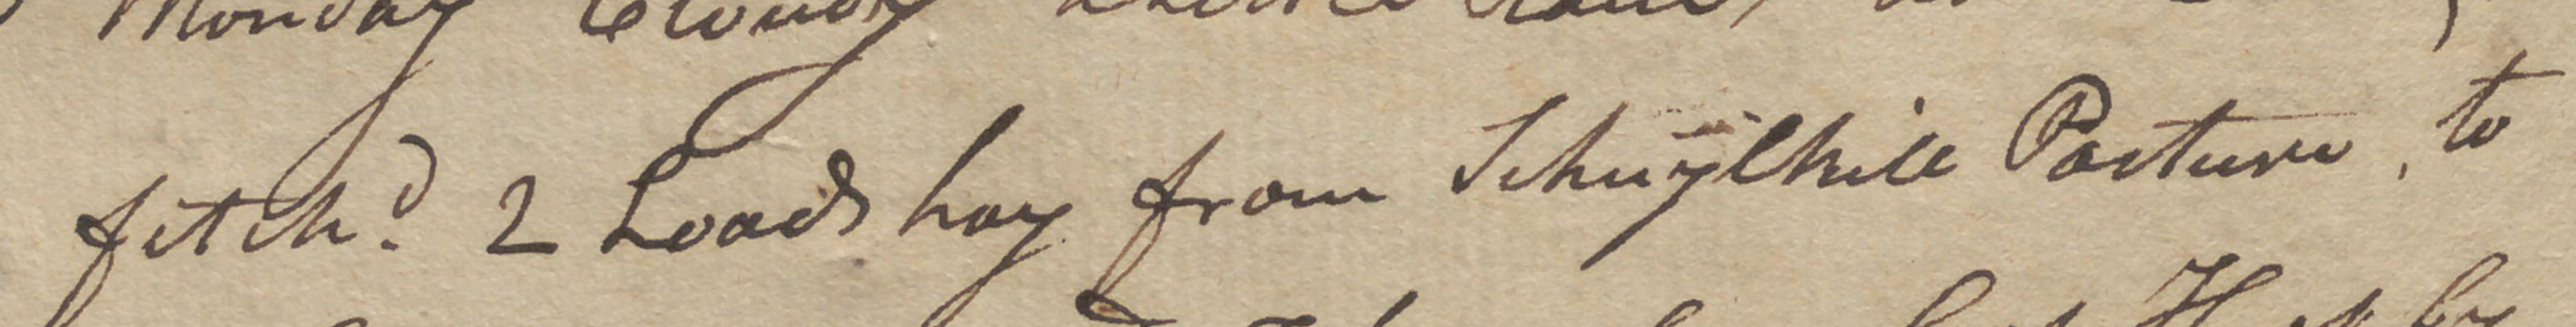fetch^d. 2 Loads hay from Schuylkill Pasture to
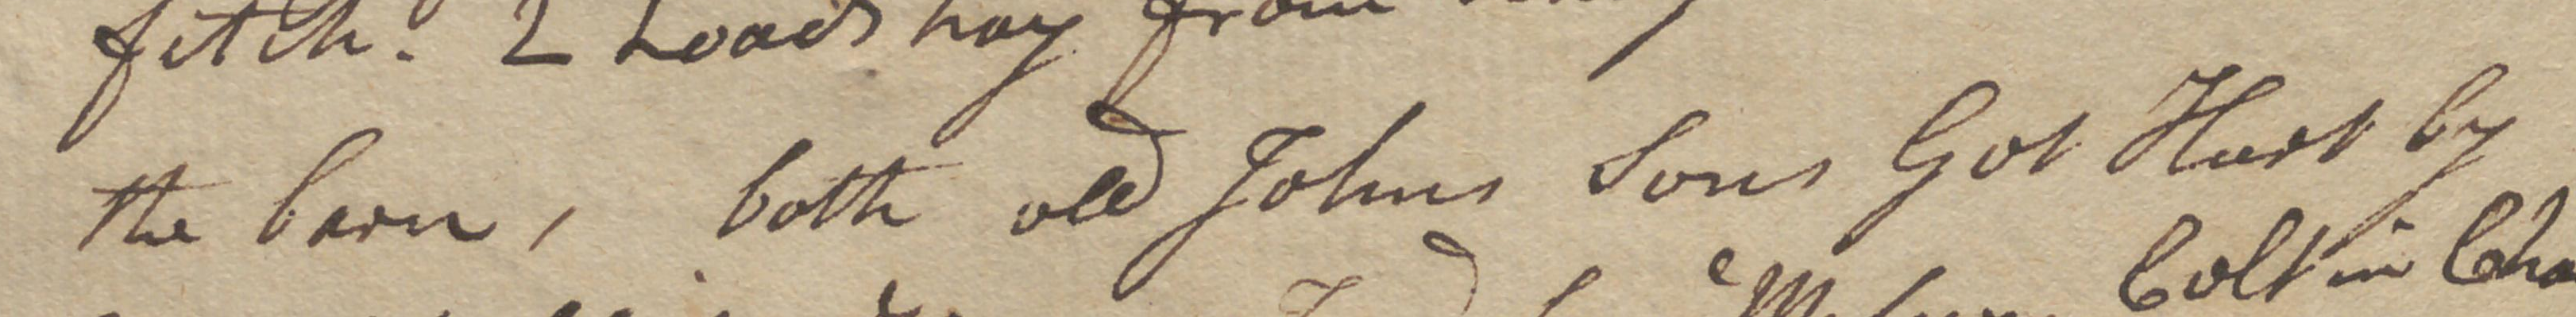the barn, both old Johns Sons Got Hurt by
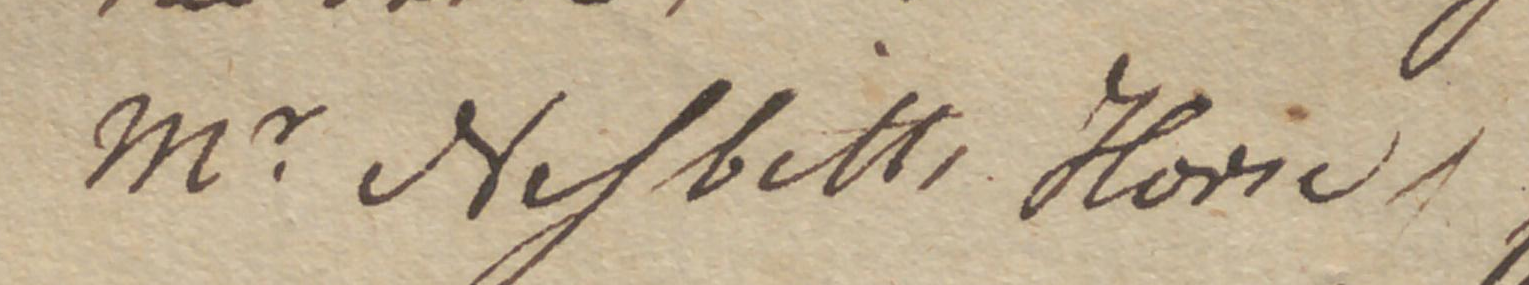M^r. Nesbetts Horse
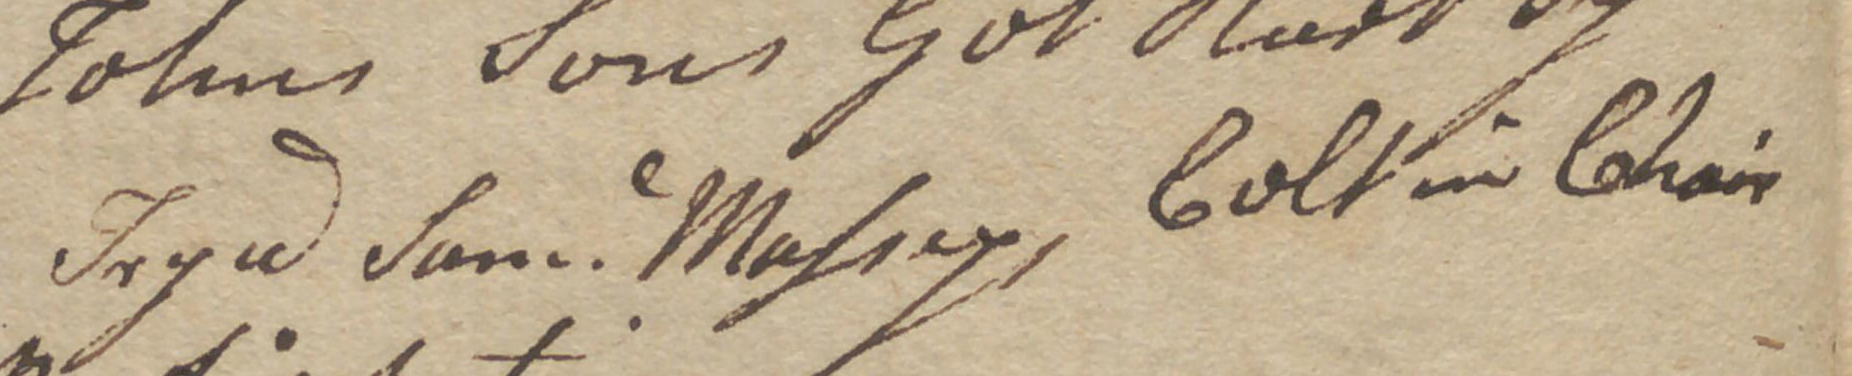Tryed Sam^l. Massey, Colt in Chair
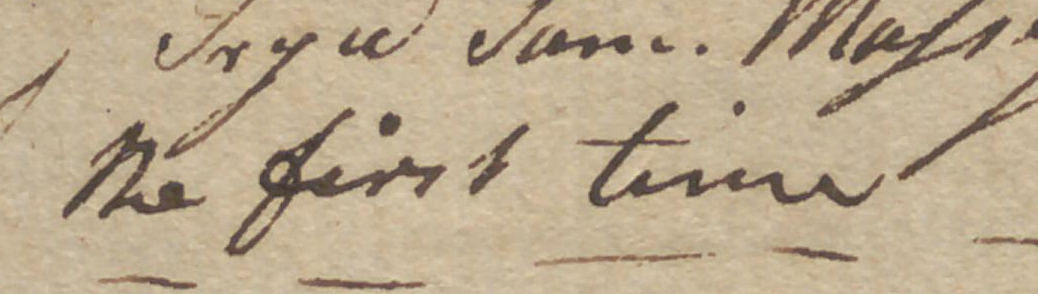the first time
